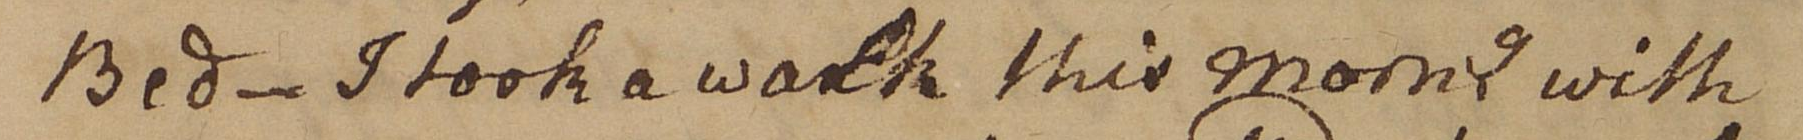Bed- I took a walk this morn^g. with
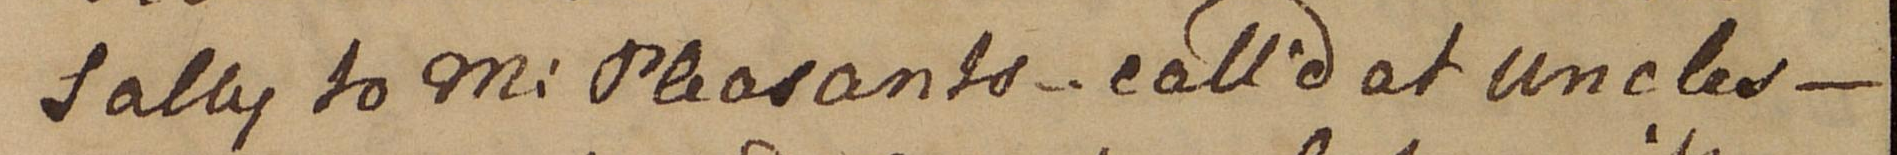Sally to M: Pleasants- call'd at Uncles-
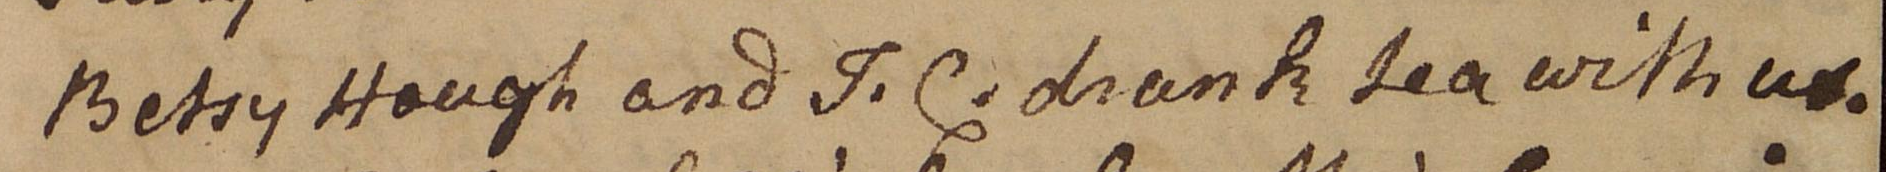Betsy Hough and J.C. drank tea with us.
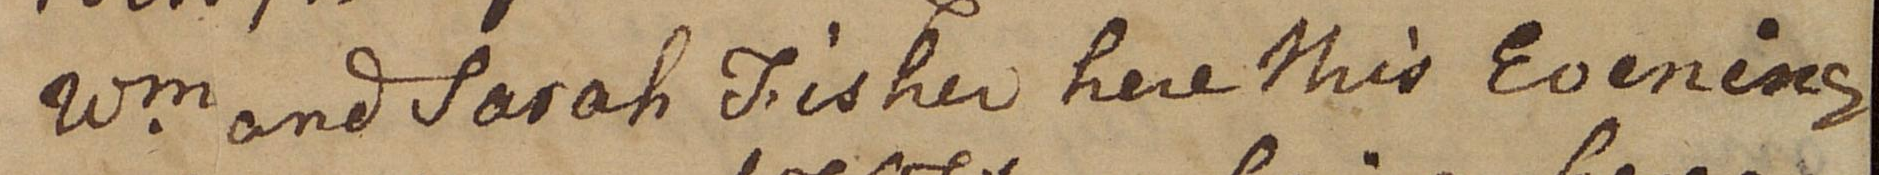W^m. and Sarah Fisher here this Evening
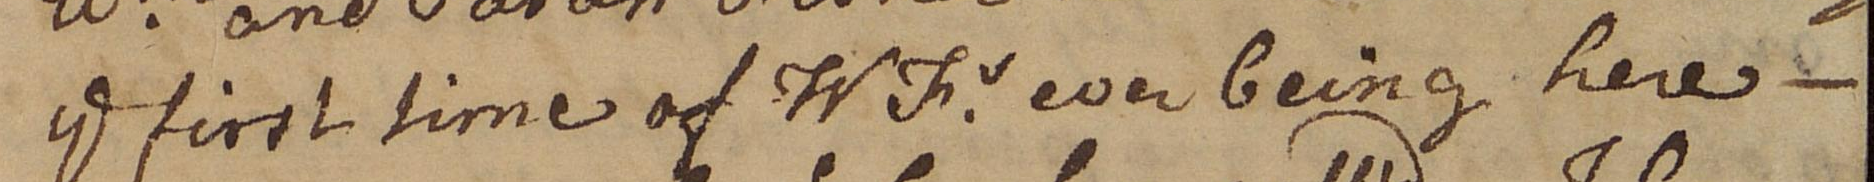y^e first time of W F^r. ever being here-
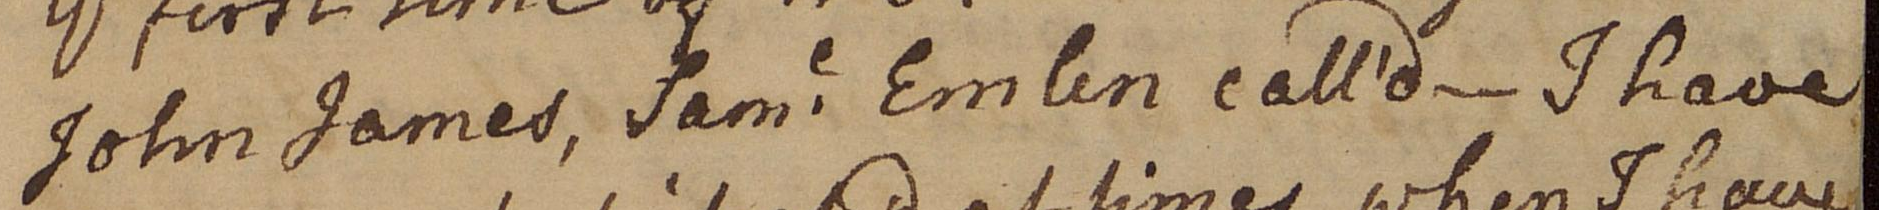John James Sam^l. Emlen call'd- I have
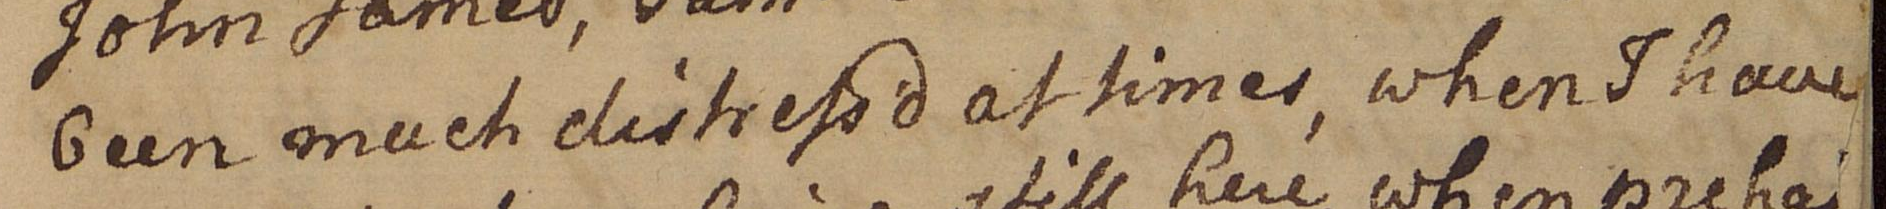been much distress'd at times, when I have
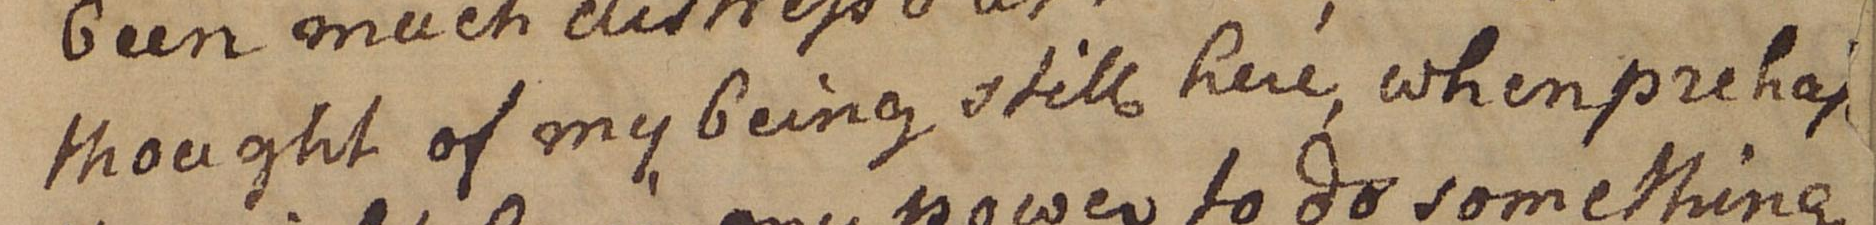thought of my being still here, when prehap
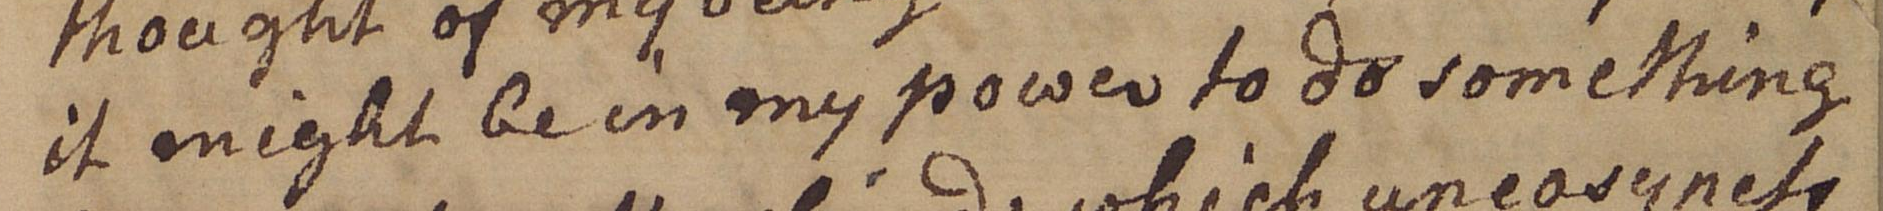it might be in my power to do something
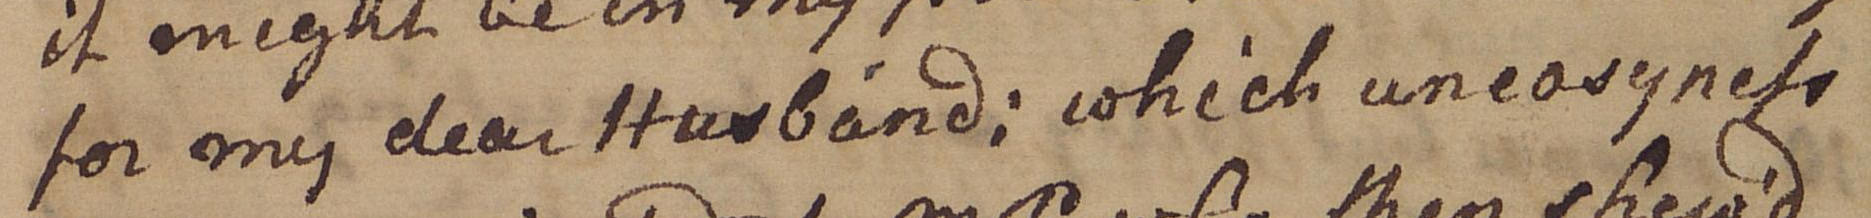for my dear Husband; which uneasyness
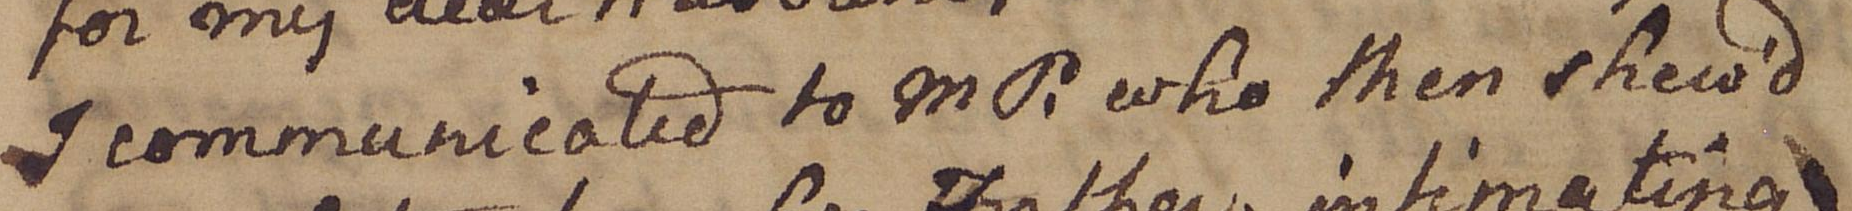I communicated to MP. who then shew'd
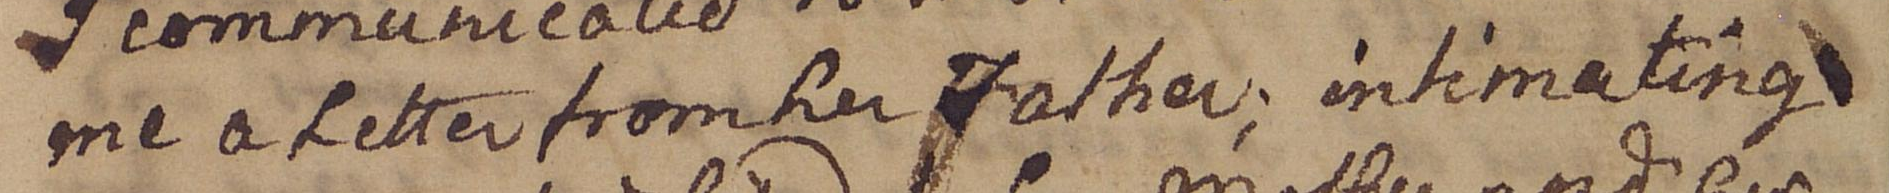me a Letter form her Father; intimating
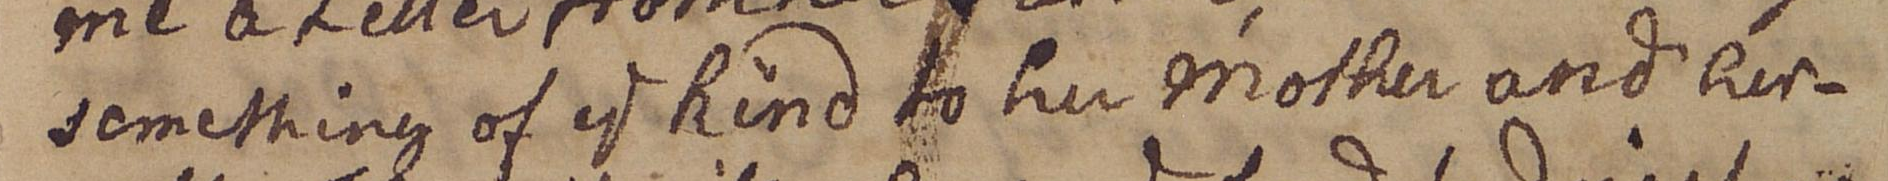something of y^e kind to her Mother and her-
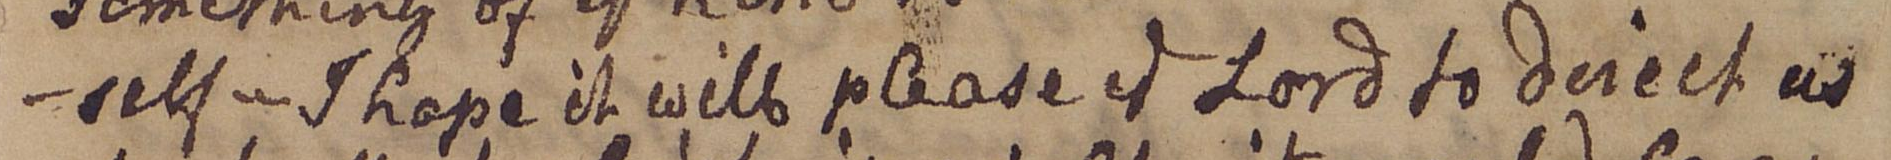-self- I hope it will please y^e Lord to direct us
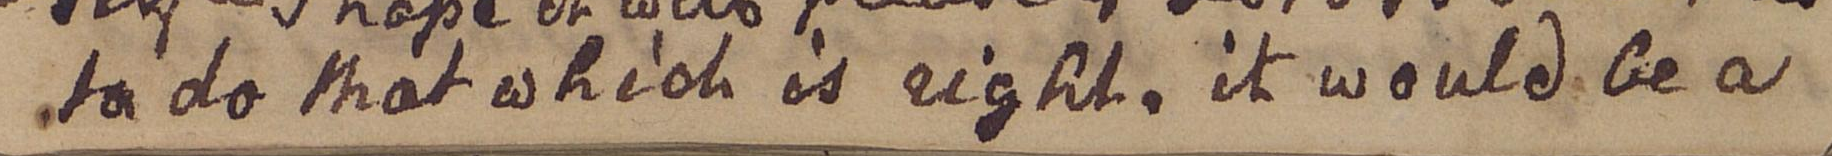to do that which is right. it would be a
